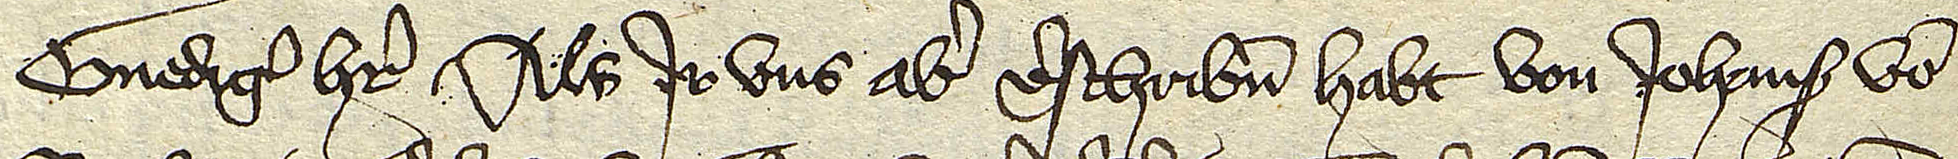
Gnedig* hr* / Als Ir vns ab* v*ſchribn* habt von Iohanſ* vo*
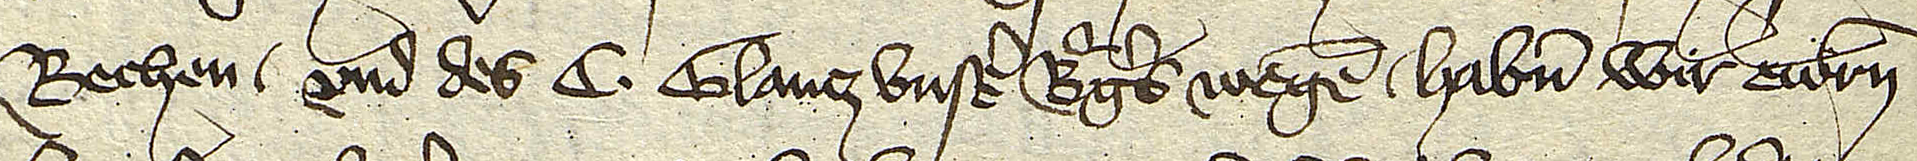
Bechen / vnd des C . Glancʒ vnſs* B*g*s wege* / habn* wir ewrn*
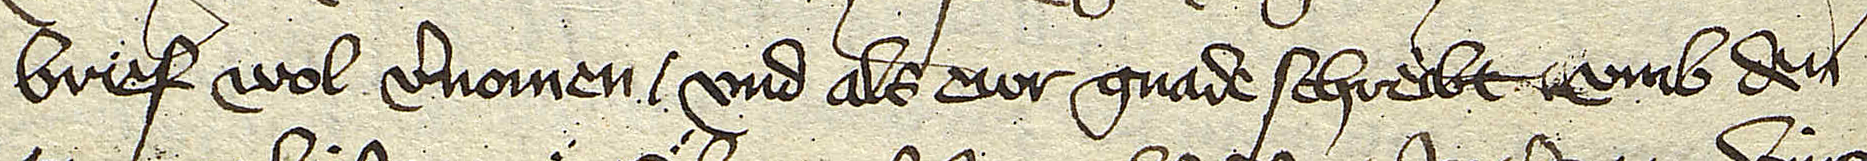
brief wol v*nomen / vnd als ewr gnade ſchreibt / vmb den
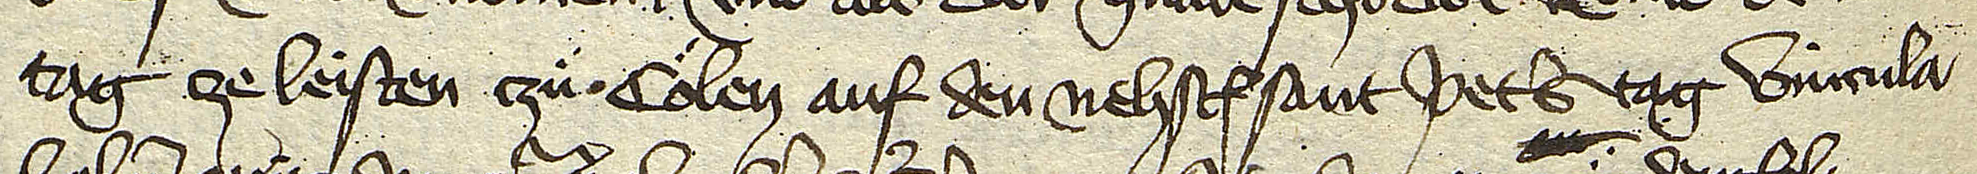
tag cʒe leiſten cʒü Cölen auf den nehſt* ſant Pet*s tag vincula
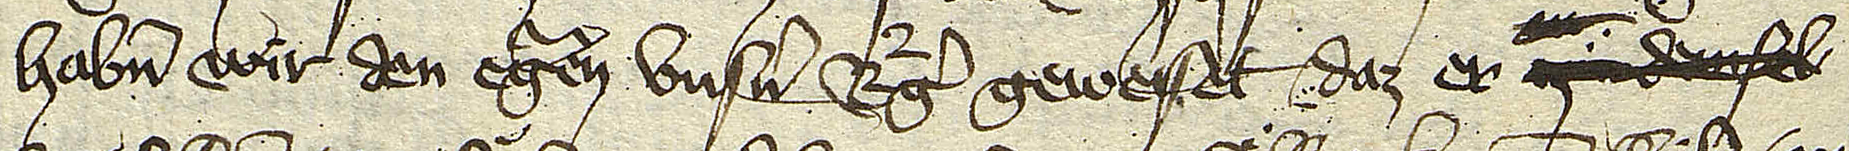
habn* wir den egen* vnſn* B*g* geweiſet / daʒ er cʒü demſel
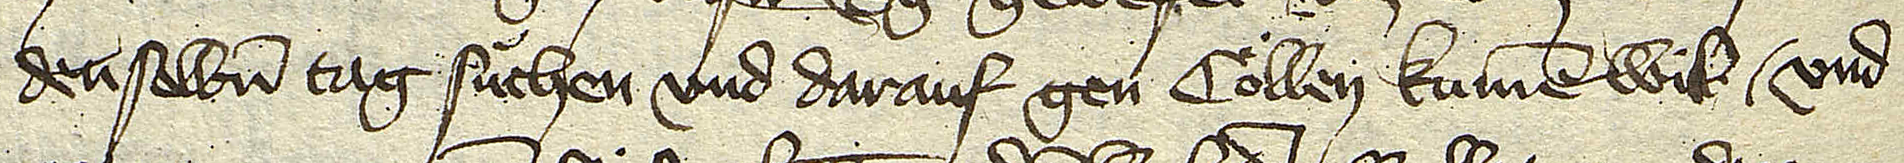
denſelbn* tag ſüchen vnd darauf gen Cöllen kume* wil / vnd
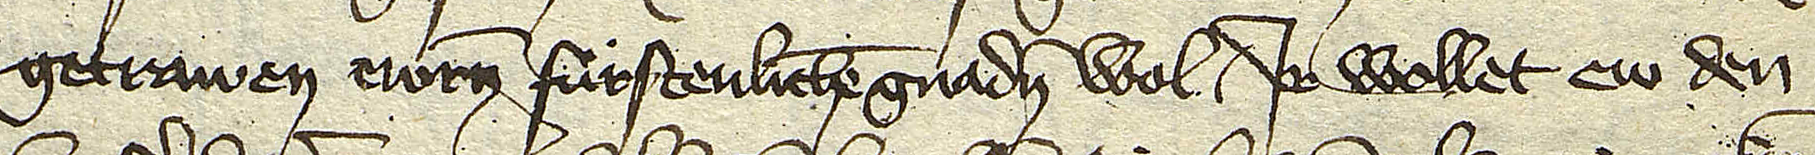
getrawen ewrn* fürſtenliche* gnadn* wol / Ir wollet ew den
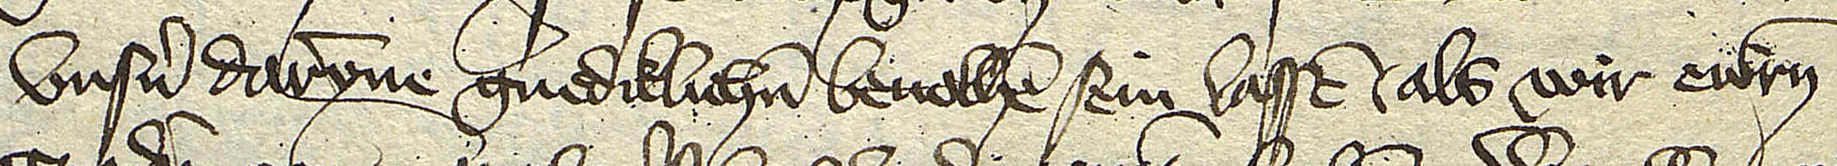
vnſn* daryne* gnediklichn* beuolhe* ſein laſſe* / als wir ewrn*
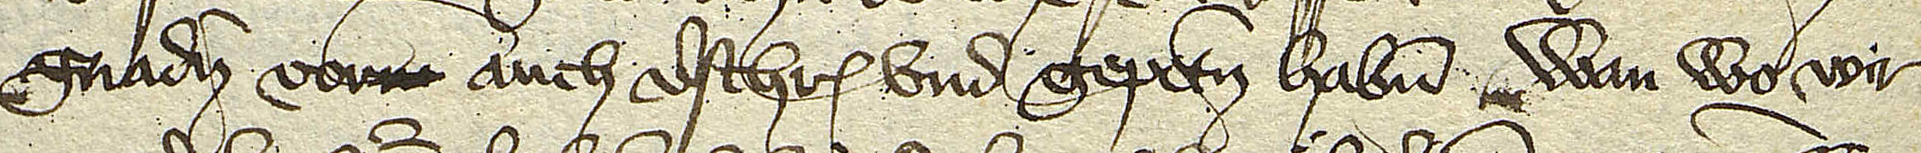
gnadn* vorm auch v*ſchr* vnd gepetn* habn* / Wan wo wir
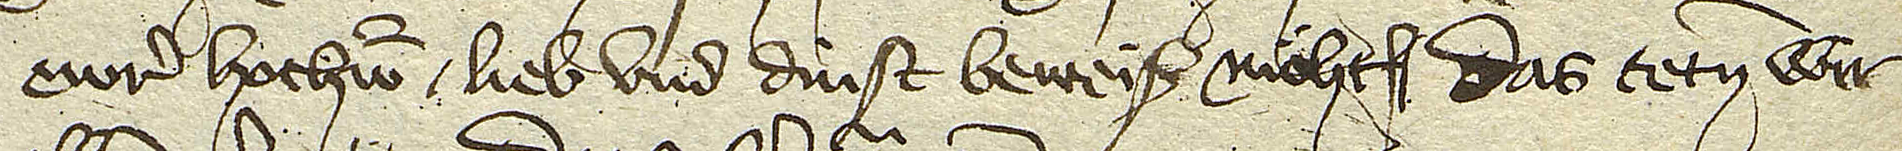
ewr* hochw* / lieb vnd dinſt beweiſ* möht* / Das tetn* wir
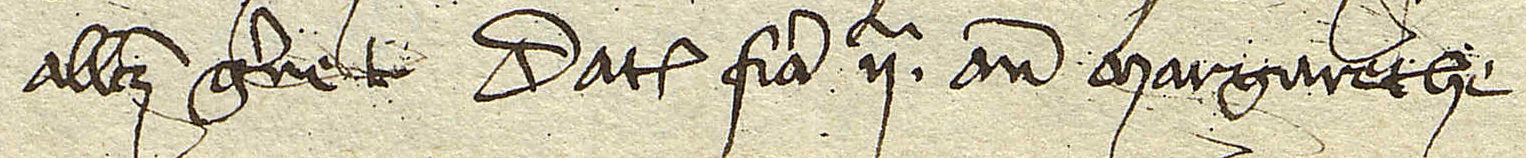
allcʒ* g*ne / Dat* fia* ii* . an* Margarethe
